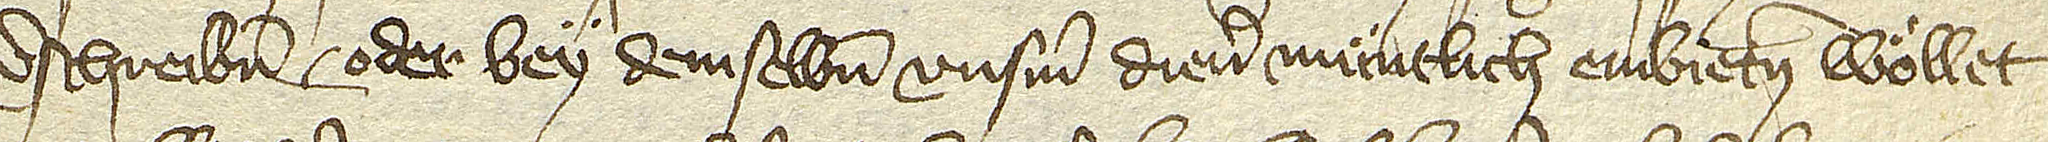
v*ſchreibn* / oder bey demſelbn* vnſm* dien* müntlich embietn* wöllet
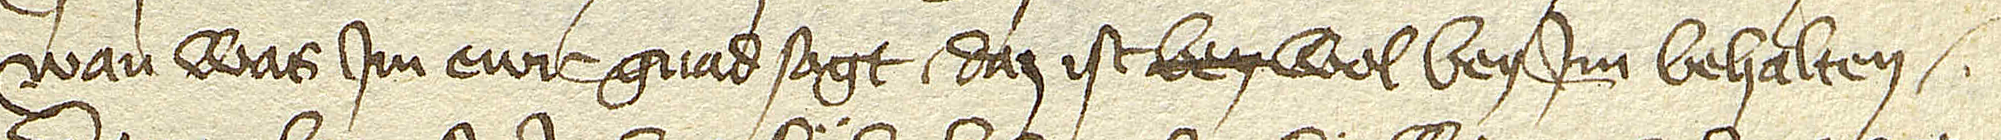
wan was Im ewr gnad ſagt / daʒ iſt bey wol bey Im behalten / .
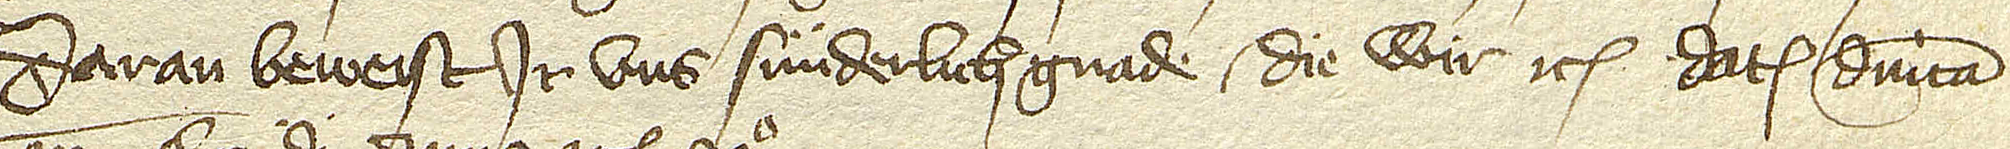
Daran beweiſt Ir vns ſünderlich gnade / die wir ec* dat* dinca*
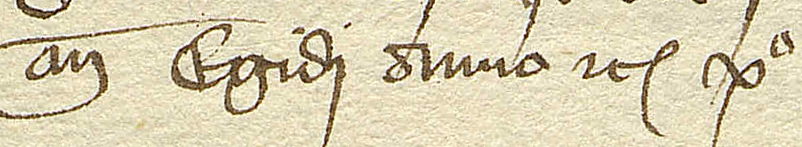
an* Egidi* Anno ec* x*
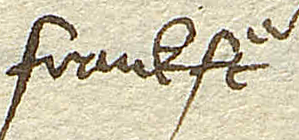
Frankft*
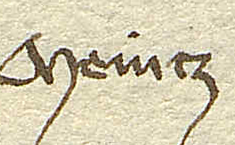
Meincʒ
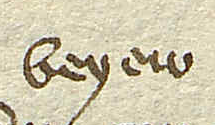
bey ew
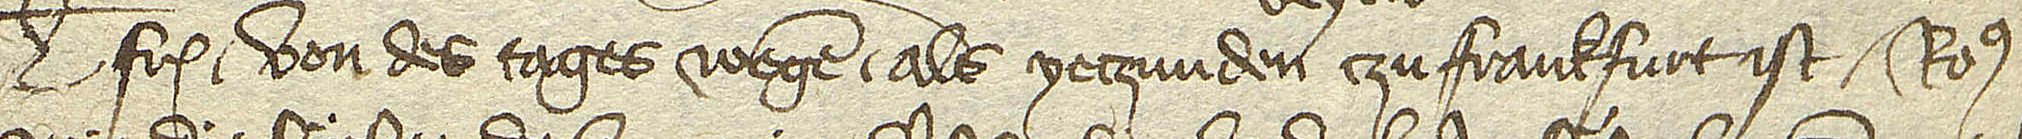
L* fr* / Von des tages wege* / als yecʒuden cʒu frankfurt iſt / Ro* /
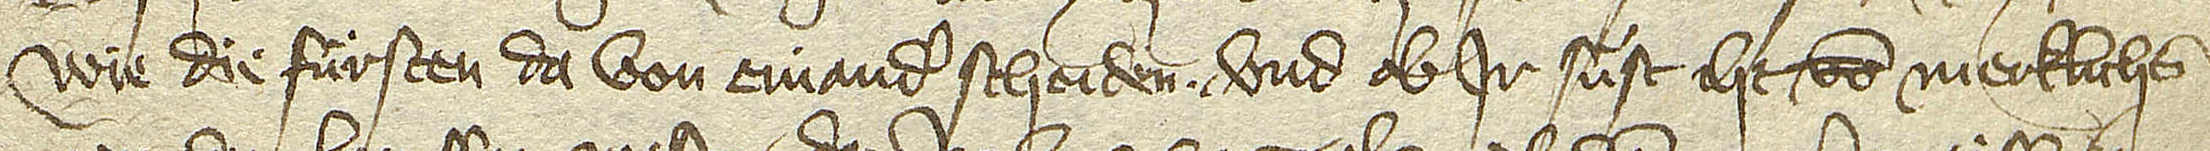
wie die fürſten da von einand* ſcheiden . / vnd ob Ir ſuſt iht vo* merklichs
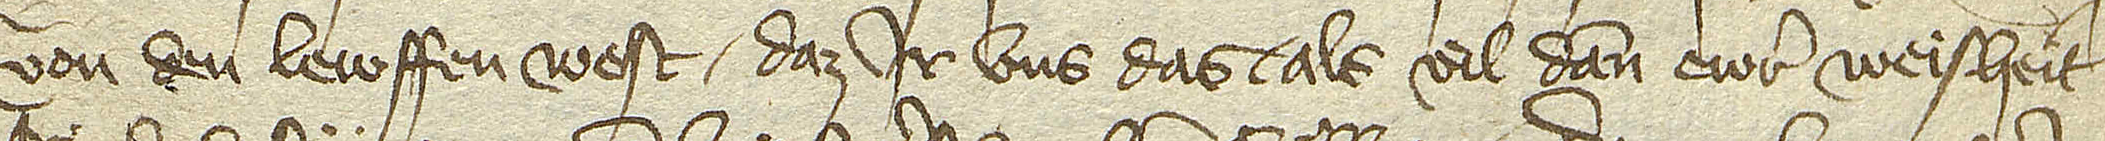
von den lewffen weſt / daʒ Ir vns das / als vil dan* ewr* weiſheit
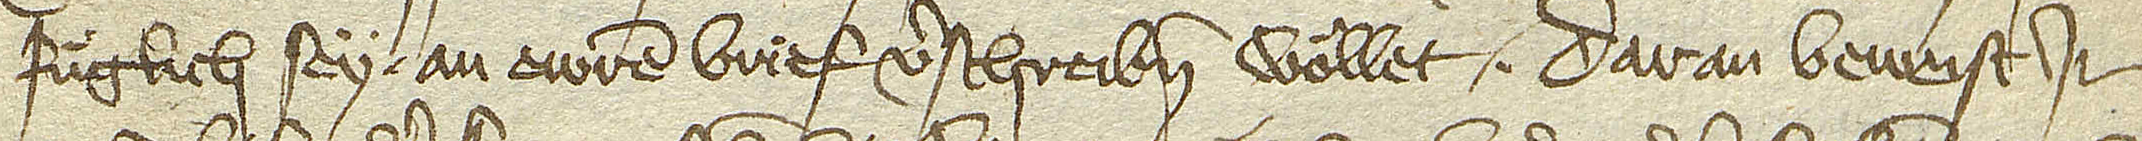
füglich ſey / an ewre* brief v*ſchreibn* wöllet / . Daran beweiſt Ir
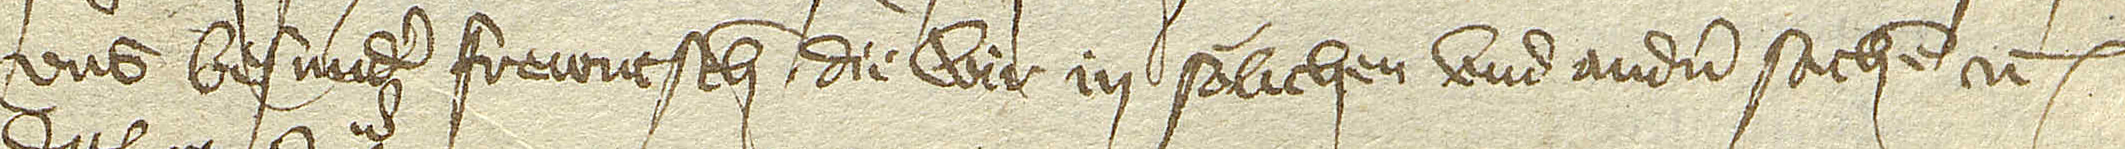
vns beſund* frewntſch* / die wir in ſölichen vnd andn* ſache* ec*
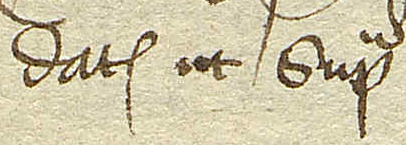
dat* ut Sup*
